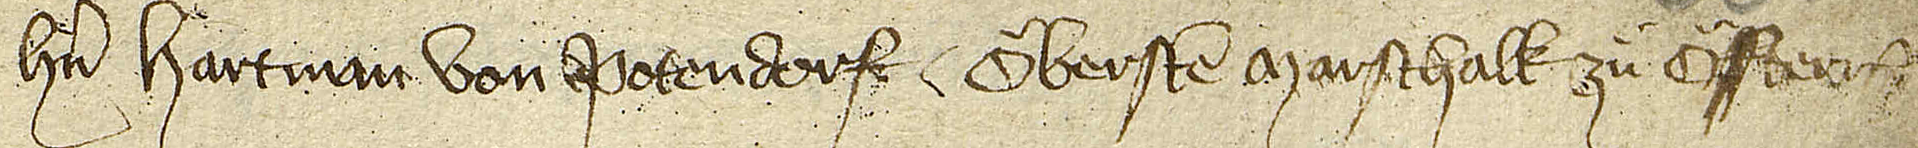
hn* hartman von Potendorf / Öberſte* Marſchalk* cʒü Öſterr*
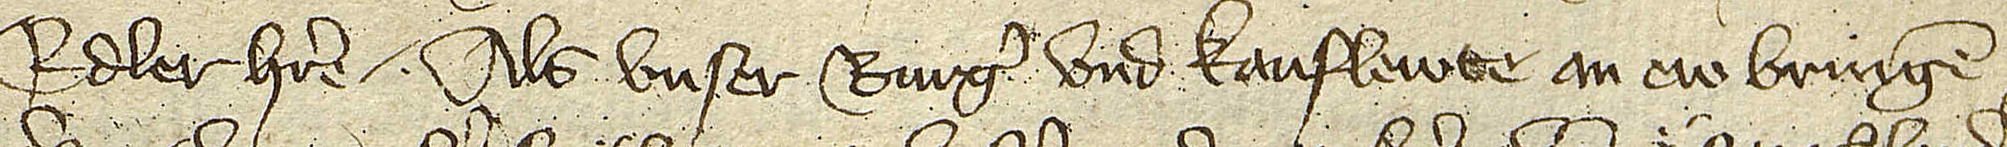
Edler hr*e /. Als vnſer Burg* vnd kauflewte an ew bringe*
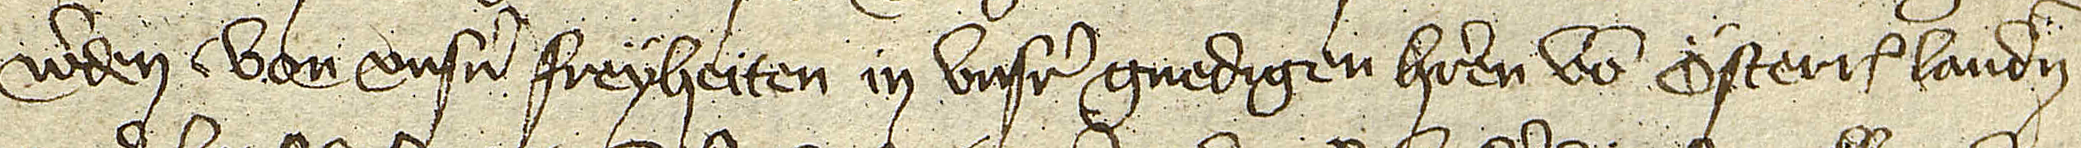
w*den / von vnſn* freyheiten in vnſr* gnedigen hr*en vo* Öſterr* landn*
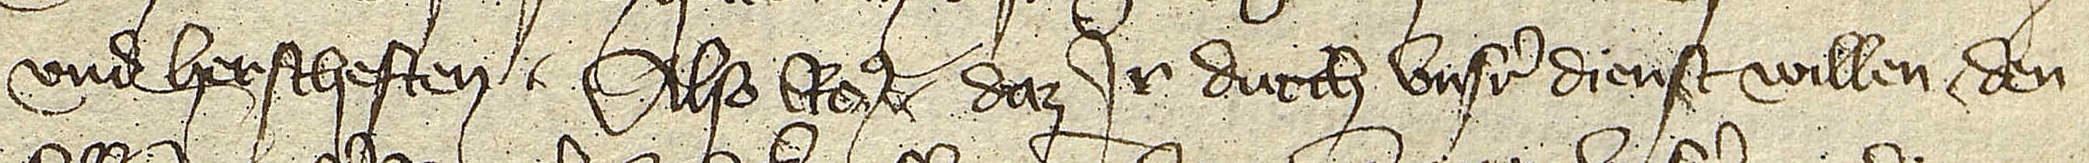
vnd herſcheften / Alſo Ro* / daʒ Ir durch vnſr* dienſt willen / den
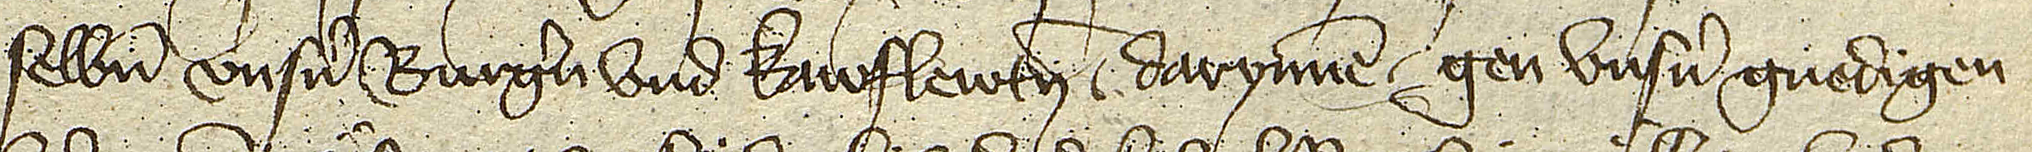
ſelbn* vnſn* Burg*n vnd kawflewtn* / darynne* / gen vnſn* gnedigen
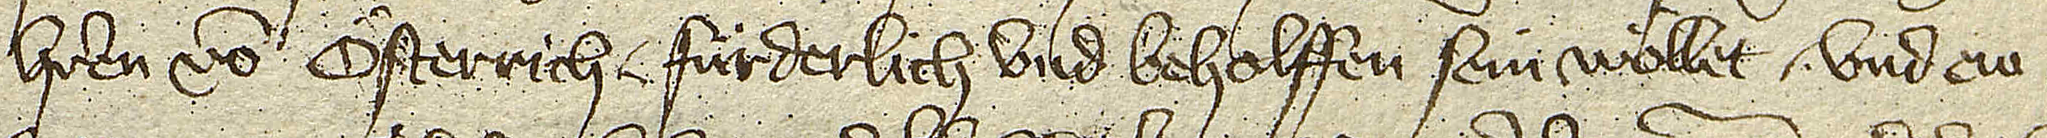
hr*en vo* Öſterrich / fürderlich vnd beholffen ſein wöllet / . vnd ew
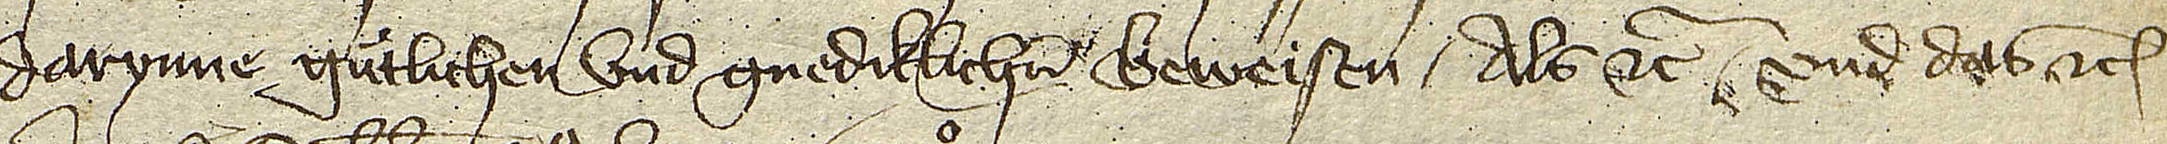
darynne gütlichen vnd gnediklichn* beweiſen / Als ec* / vnd das ec*
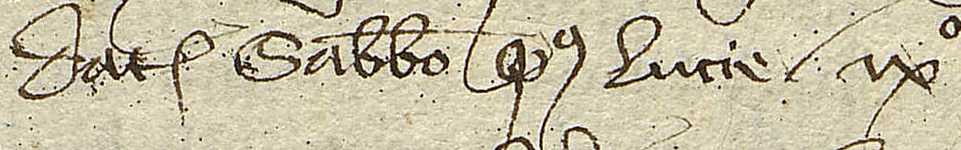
Dat* Sabbo* p* Lucie / ix*
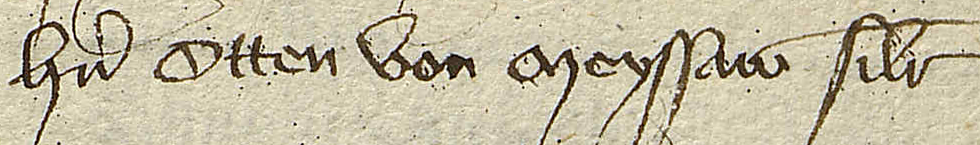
hn* Otten von Meyſſaw ſilr*
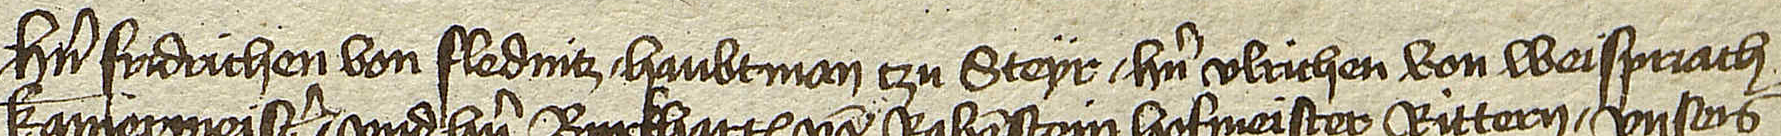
hn* fridrichen von flednitʒ / haubtman cʒu Steyr / hn* vlrichen von weiſpriach
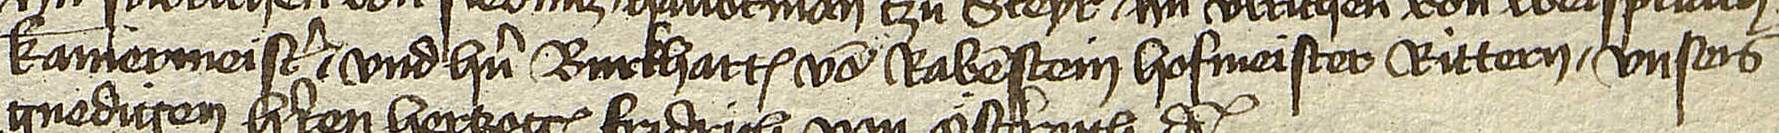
kamermeiſt* / vnd hn* Burkhart* vo* Rabe*ſtein hofmeiſter Rittern / vnſers
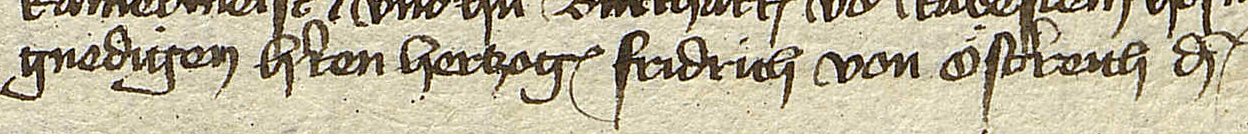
gnedigen h*ren hercʒog* fridrich von Öst*reich d*
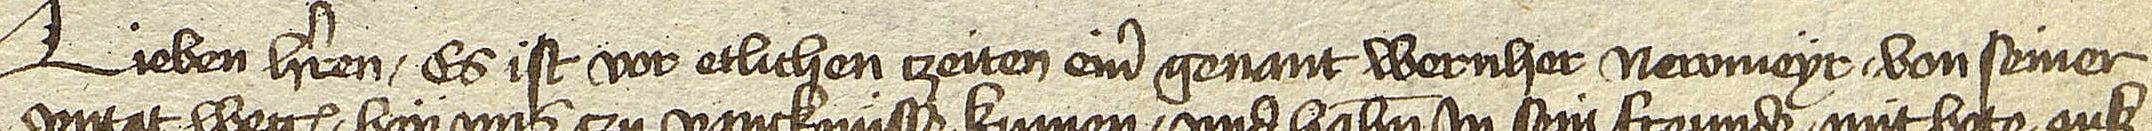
Lieben h*ren / Es iſt vor etlichen cʒeiten ein* genant Wernher Newmeyr / von ſeiner
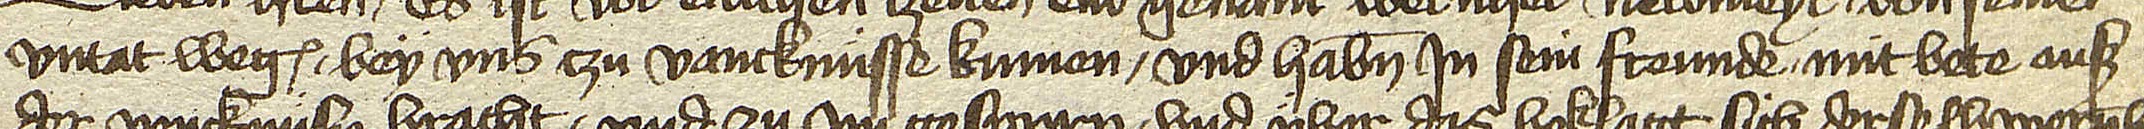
vntat weg* / bey vns cʒu vancknüſſe kumen / vnd habn* In ſein freunde / mit bete auſʒ
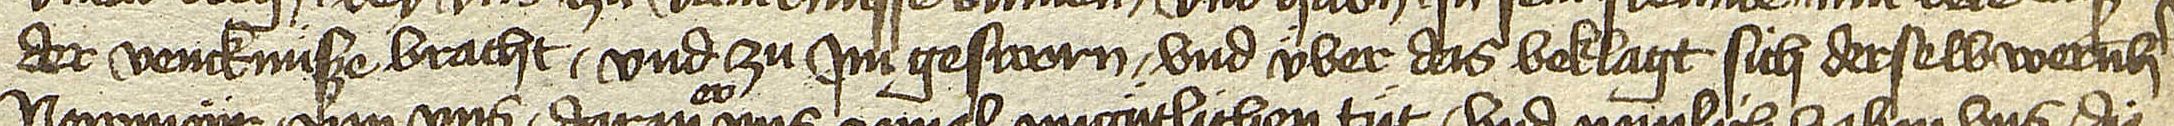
der venknüſʒe braht / vnd cʒu Im geſworn / vnd v̈ber das beklagt ſich derſelb wernh*
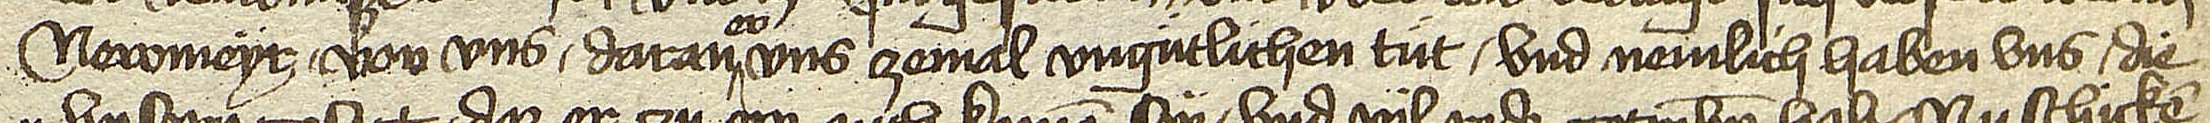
Newmeyr / von vns / daran vns cʒemal vngütlichen tüt / vnd nemlich haben vns / die
